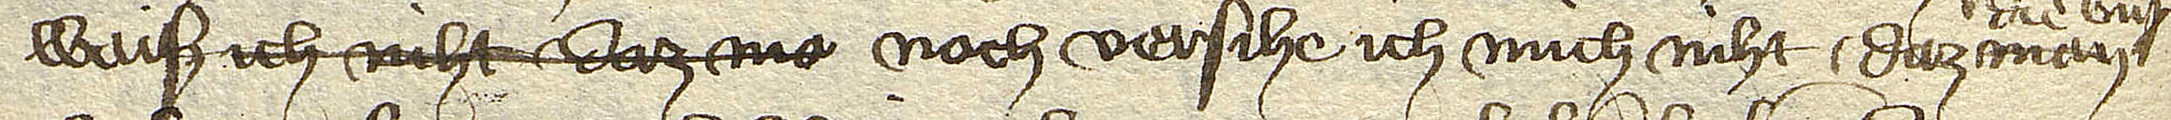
waiſʒ ich nicht / daʒ ma noch verſihe ich mich niht / daʒ man
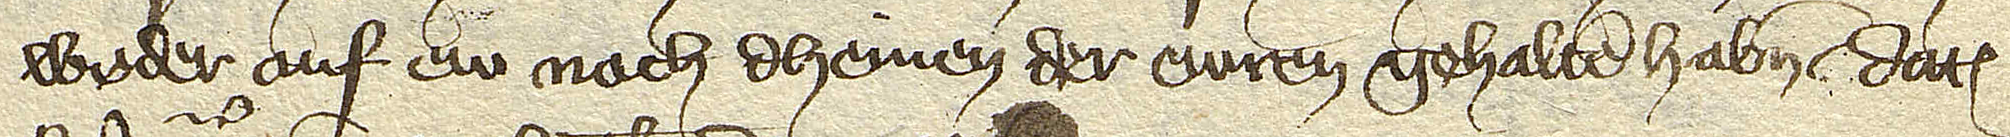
weder auf ew noch dheinen der ewren gehalte* habn* / dat*
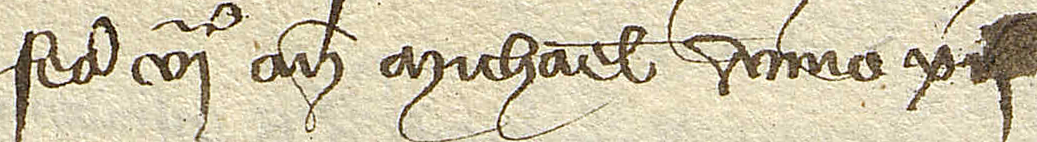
fea* vi* an* Michael* Anno xii
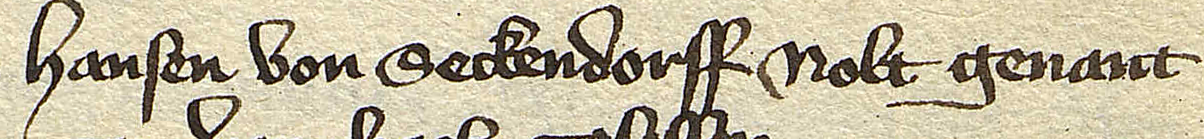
hanſen von Seckendorff Nolt genant
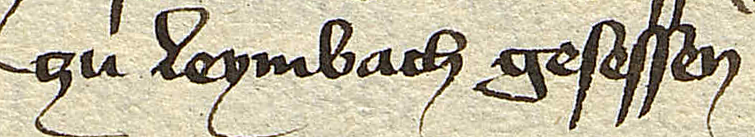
cʒu leymbach geſeſſen
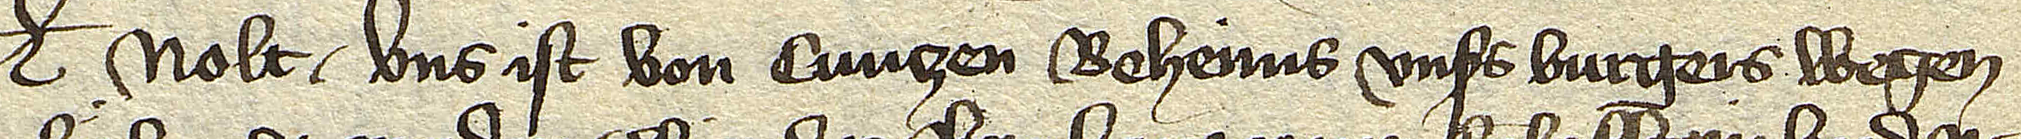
L* Nolt / vns iſt von Cuncʒen Beheims vnſ*s burgers wegen
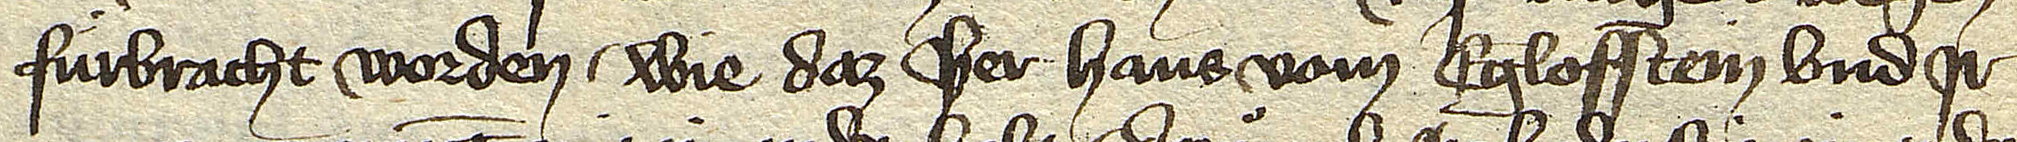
fürbracht worden / wie daʒ her hans vom Eglofſtein vnd Ir
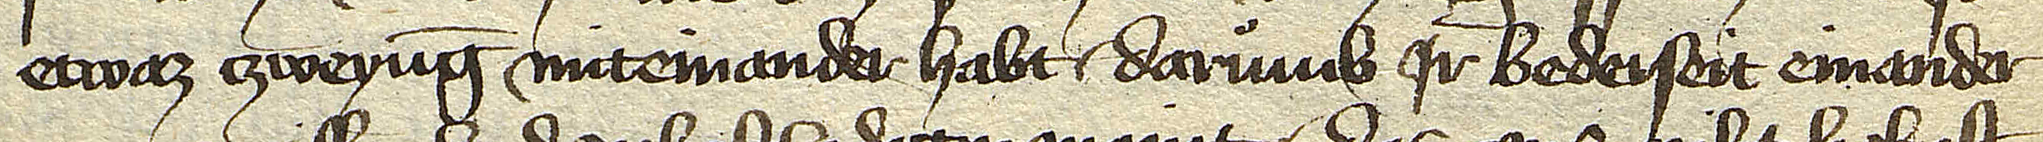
etwaʒ cʒweyug* miteinander habt / darümb Ir bederſeit einander
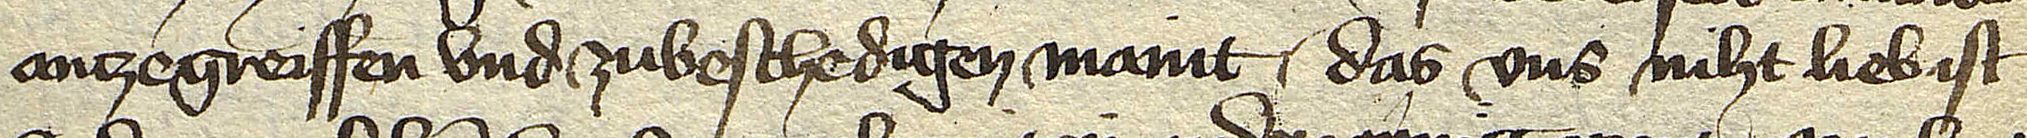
ancʒegreiffen vnd cʒubeſchedigen maint / das vns niht lieb iſt
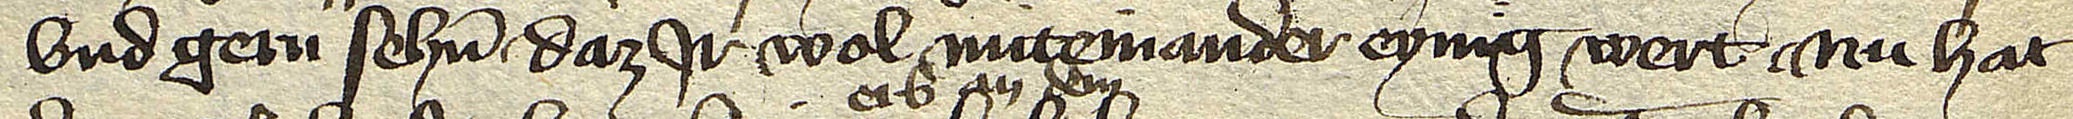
vnd gern ſehn* / daʒ Ir wol miteinander eynig wert / Nu hat
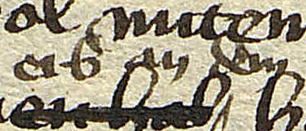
erb an dem
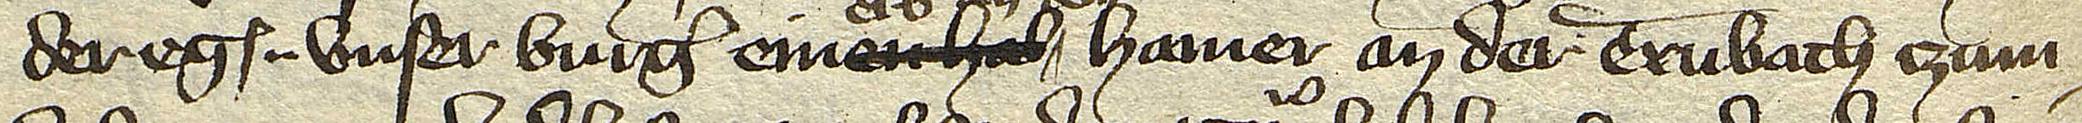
der eg* ~ vnſer burg* einen ha hamer an der Trubach cʒum
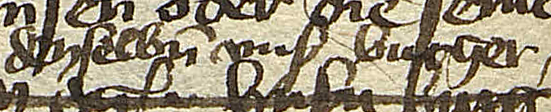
denſelbn* vnſ* burger
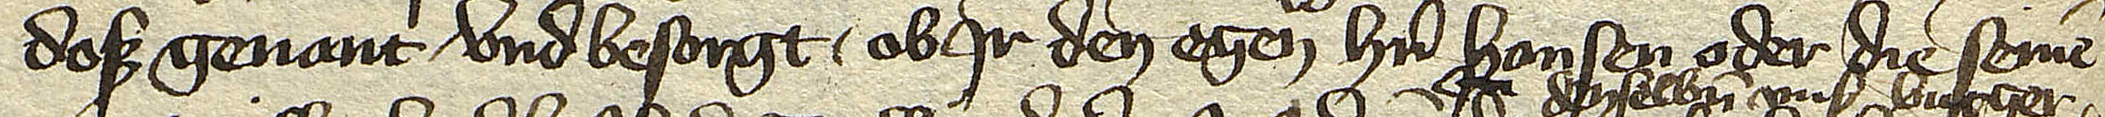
doſʒ genant / vnd beſorgt / ob Ir den egen* hn* hanſen oder die ſeine*
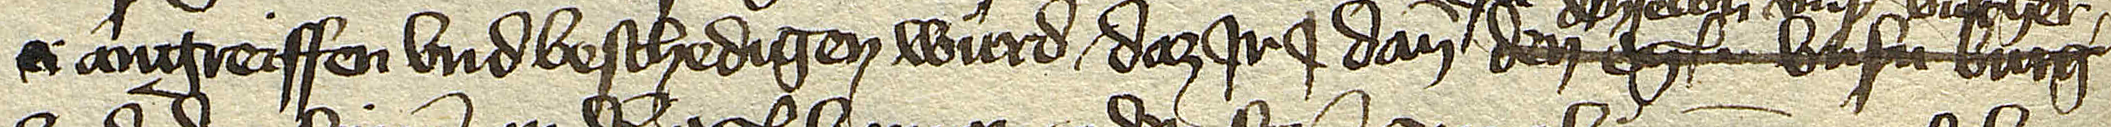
% angreiffen vnd beſchedigen würd / daʒ Ir I dan* den eg* ~ vnſ*n burg*
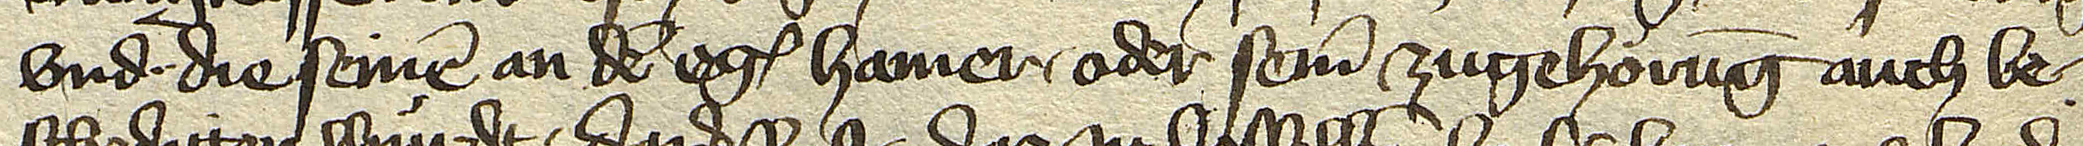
vnd ~ die ſeine* an de* eg* hamer / oder ſein* cʒugehörug* auch be -
